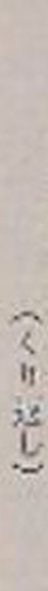(くり返し)
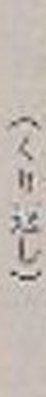(くり返し)
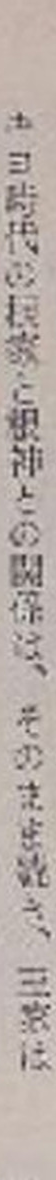キヨ時代の根と根神との関係は、そのまま続き、王は
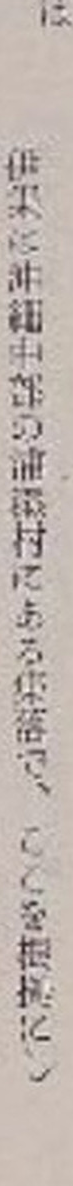伊集は沖縄中部の浦添村にある集落で、ここを根拠にし
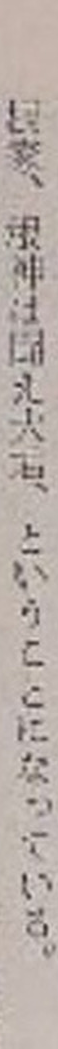根、根神は聞え大君、ということになっている。
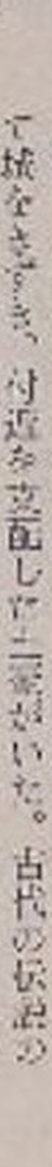て城をきずき、付近を支配した土豪がいた。古代の伝説の
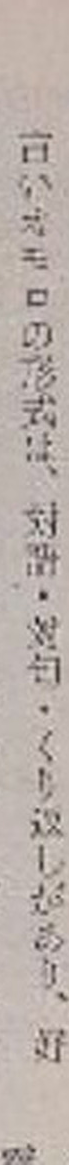古いオモロの形式は、対語・対句・くり返しがあり、好
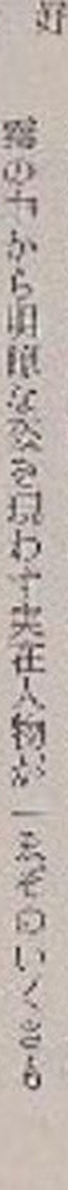霧の中から明瞭な姿を現わす実在人物が「ゑぞのいくさも
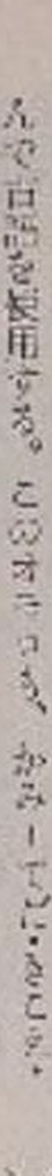んで古語を使用する。このオモロも、かみ―てだ・きこゑ・
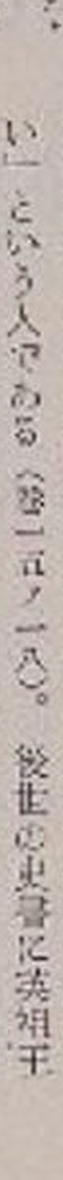い」という人である(巻一五ノ一八)。後世の史書に英祖王
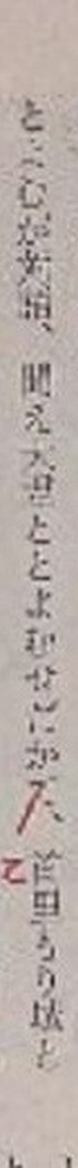とよむが対語、聞え大君ととよむせだかこ、首里もり城と
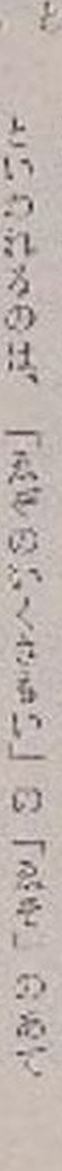といわれるのは、「ゑぞのいくさもい」の「ゑそ」のあて
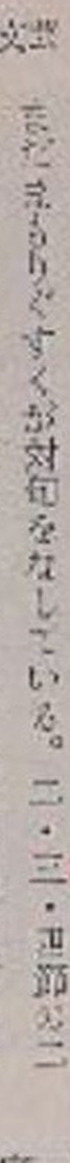まだまもりぐすくが対句をなしている。二・三・四節の二
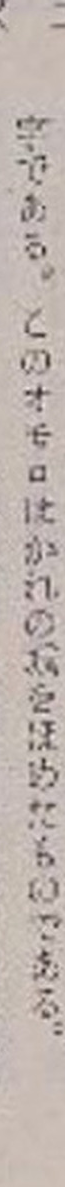字である。このオモロはかれの城をほめたものである。
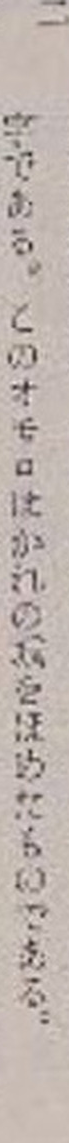字である。このオモロはかれの城をほめたものである。
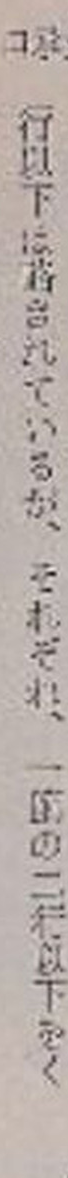行以下は略されているが、それぞれ、一節の二行以下をく
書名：沖縄口承文芸
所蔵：University of the Ryukyus Library
